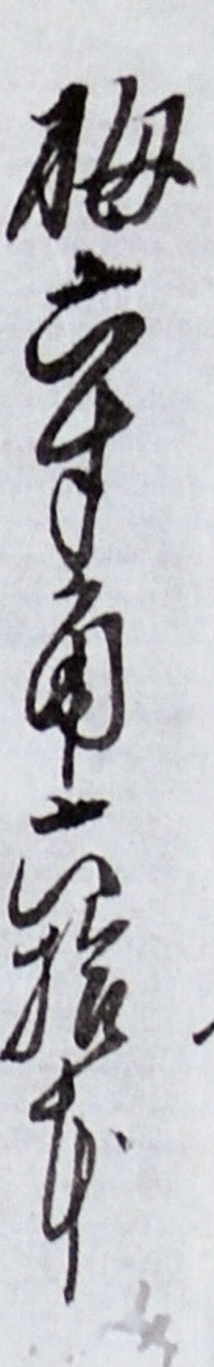同六寸角拾本
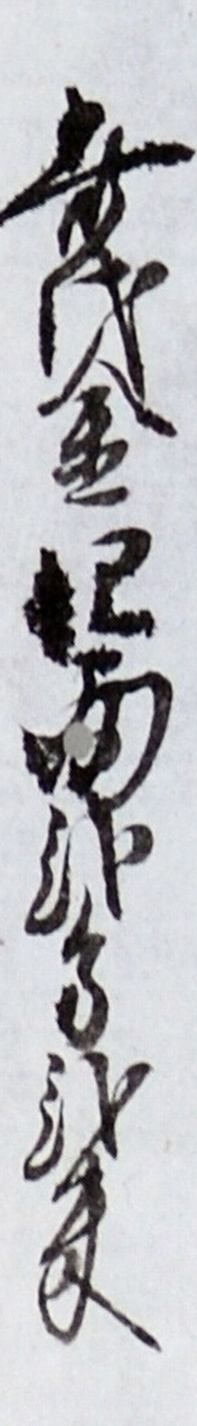此代金四両弐分弐朱
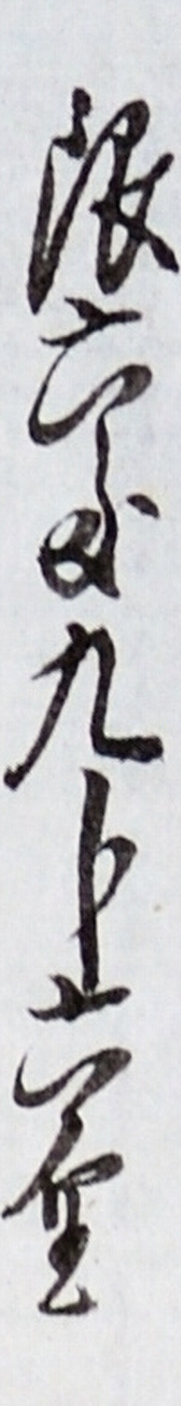銀六匁九分六厘
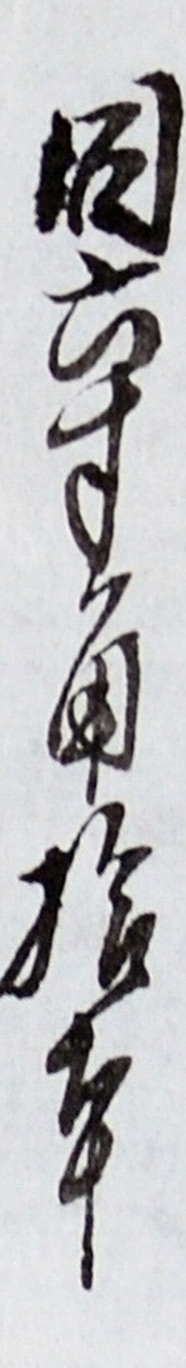同六寸角拾本
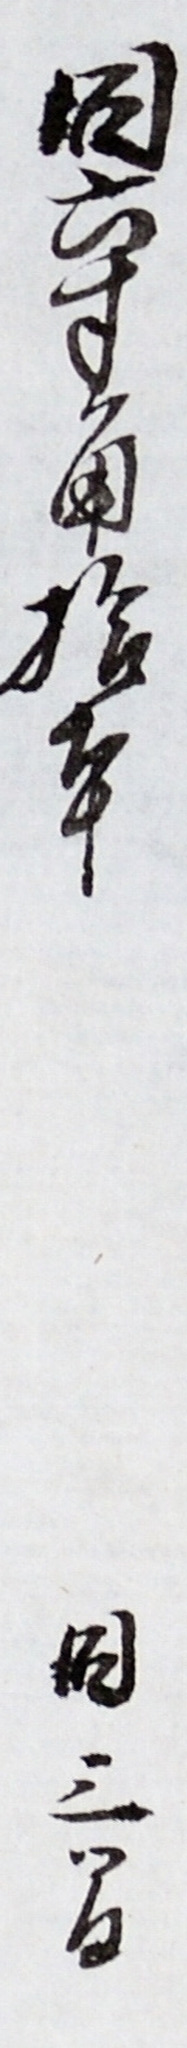同六寸角拾本同三間
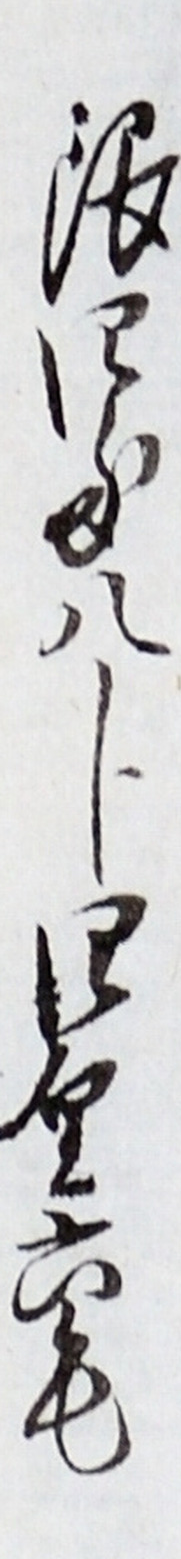銀四匁八分四厘六毛
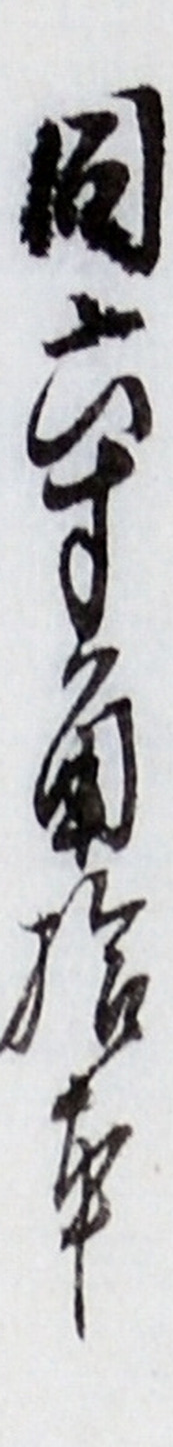同六寸角拾本
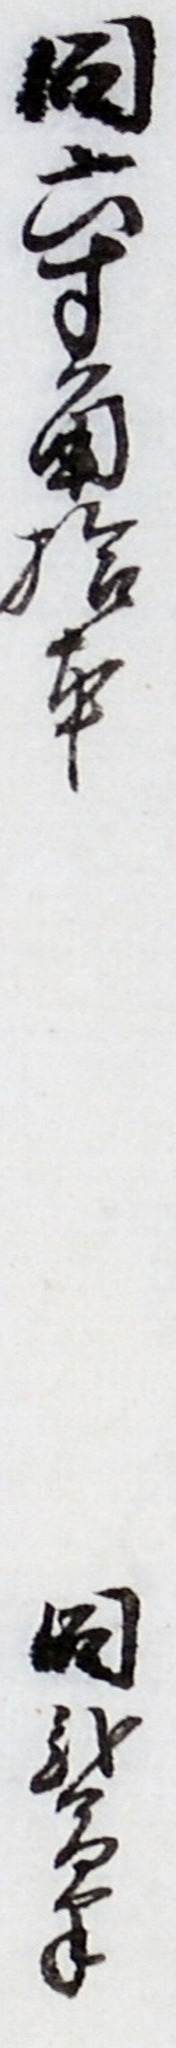同六寸角拾本同三間
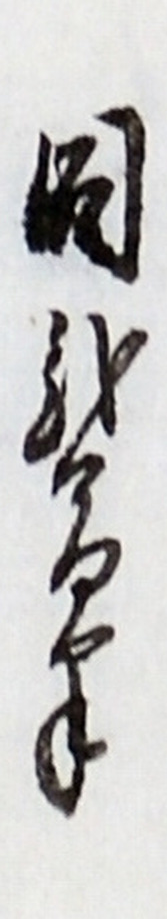同弐間半
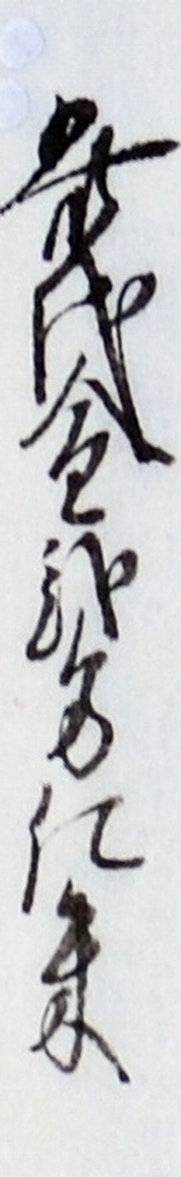此代金弐分仁朱
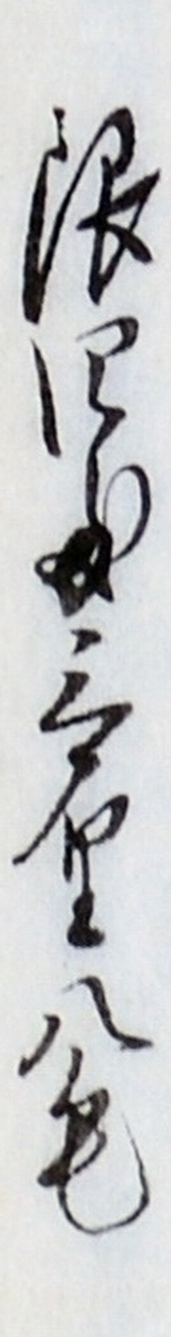銀四匁三厘八毛
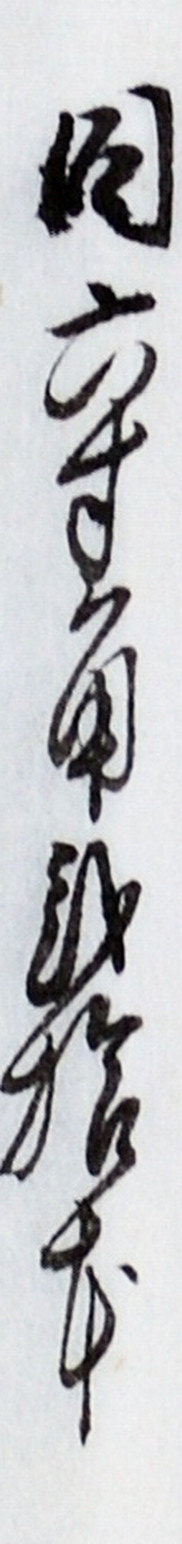同六寸角拾本
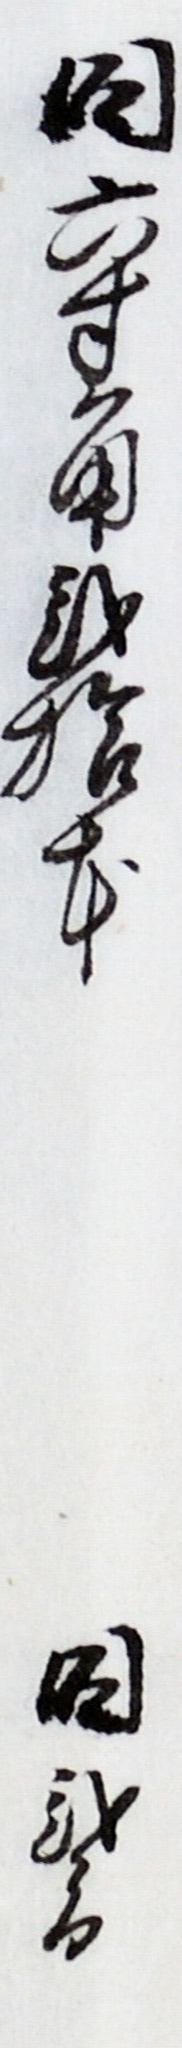同六寸角弐拾本同弐間
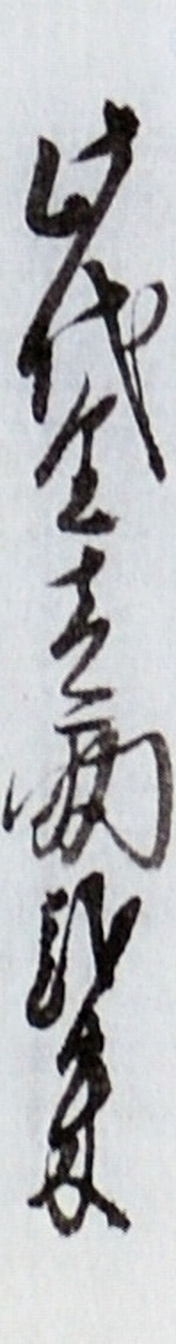此代金壱両弐朱
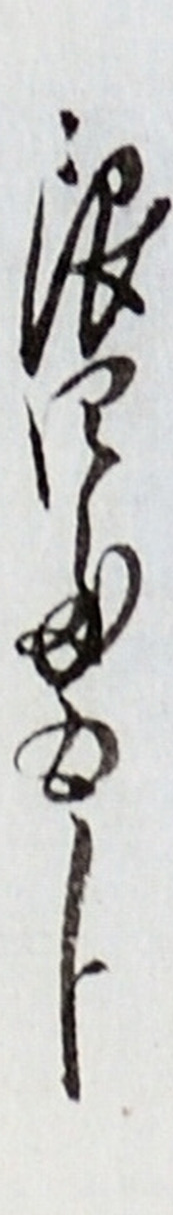銀四匁五分
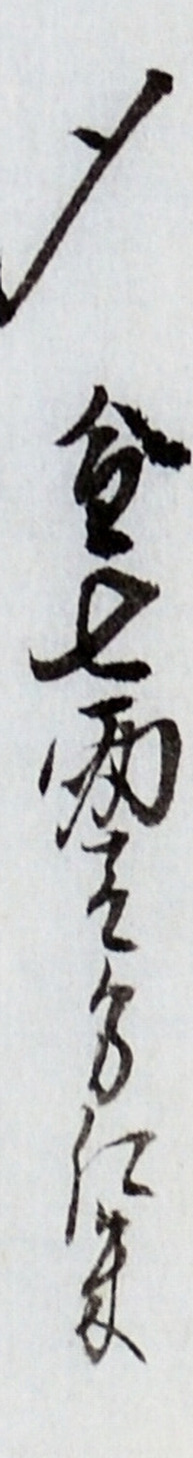〆金七両壱分仁朱
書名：御山奉行御用控
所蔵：伊那市立高遠町図書館・合同会社AMANE
